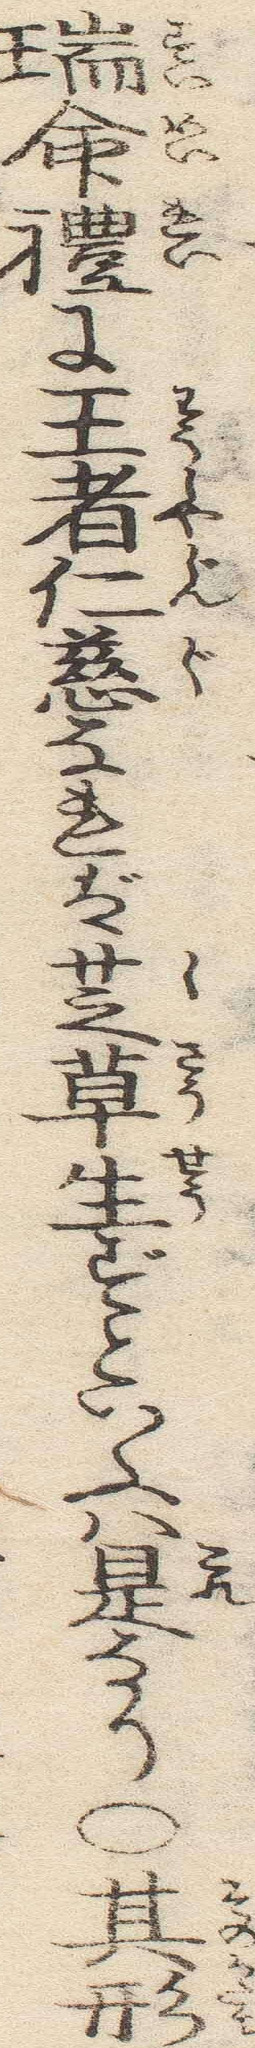瑞命礼に王者仁慈なれば芝草生ずといふは是なり○其形
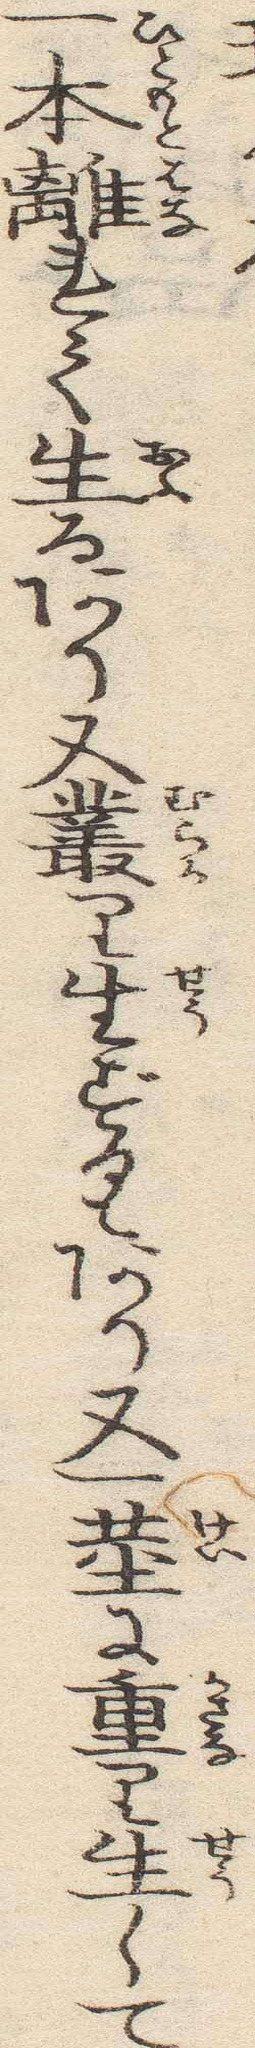一本離れて生るあり又叢り生ずるもあり又一茎に重り生して
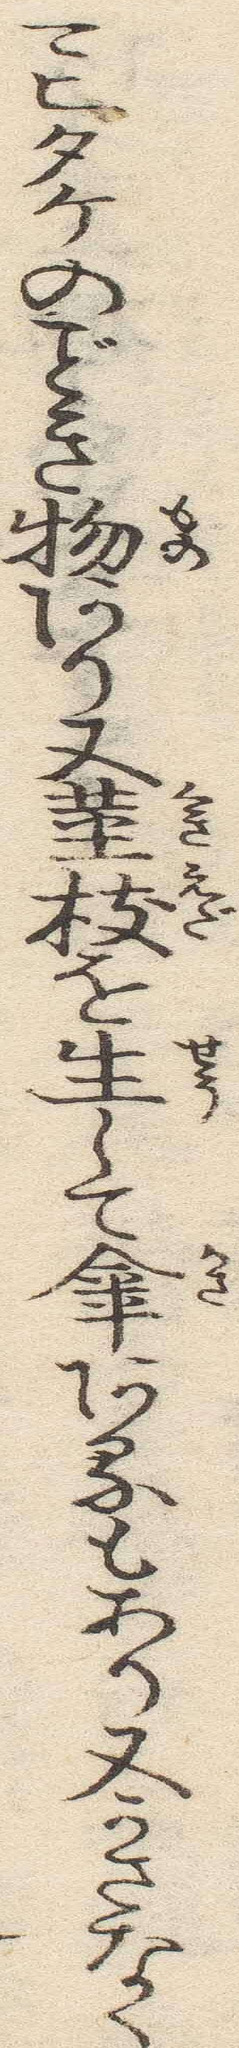マヒタケのごとき物あり又茎枝を生して傘あるもあり又かさなく
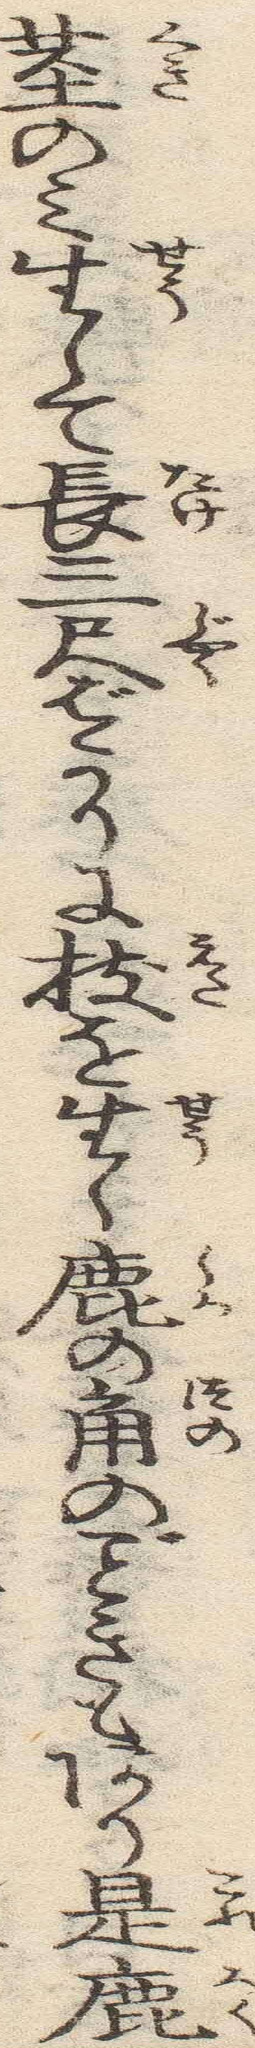茎のみ生して長三尺ばかりに枝を生し鹿の角のごときもあり是鹿
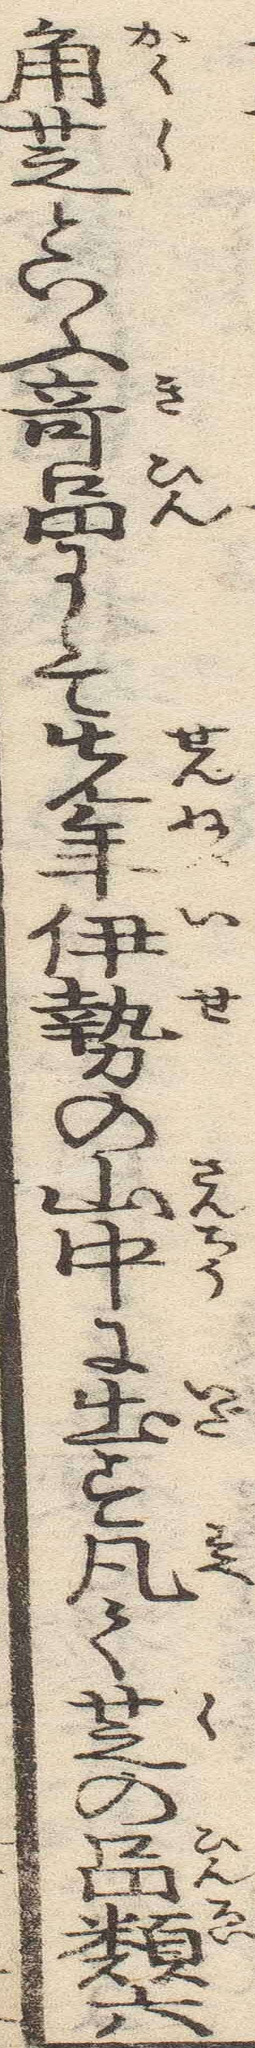角芝といふ奇品にして先年伊勢の山中に出す凡て芝の品類六
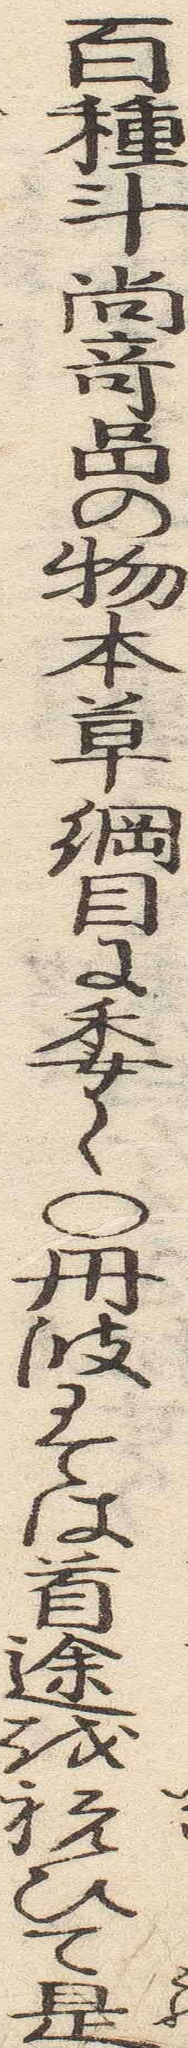百種斗尚奇品の物本草綱目に委し○丹波にては首途を祝ひて是
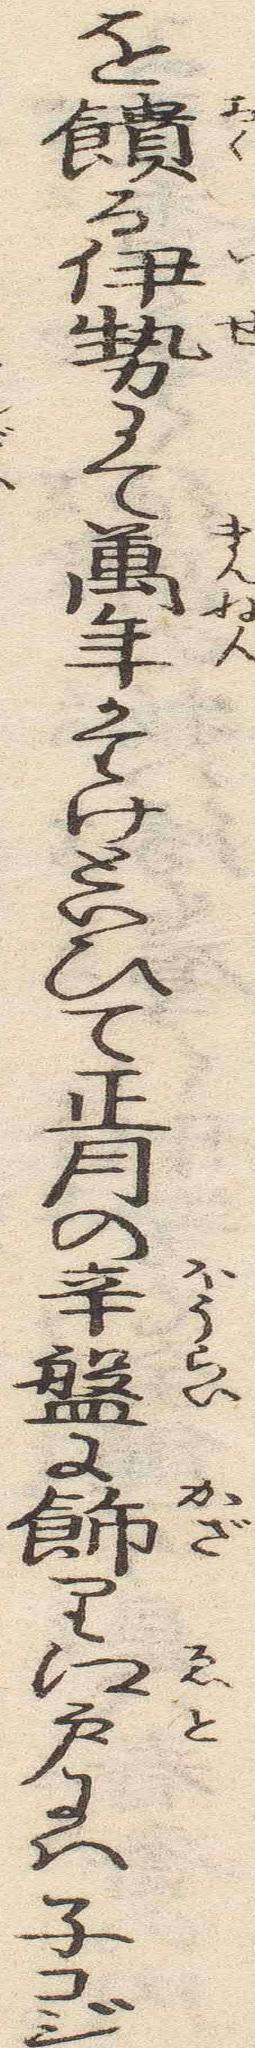を饋る伊勢にて万年たけといひて正月の辛盤に飾り江戸にはネコジ
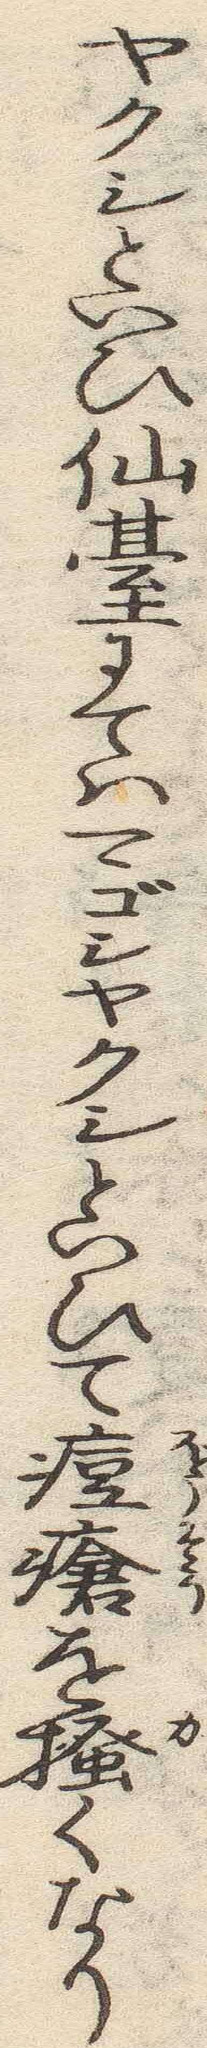ヤクシといひ仙台にてはマゴシヤクシといひて痘瘡を掻くなり
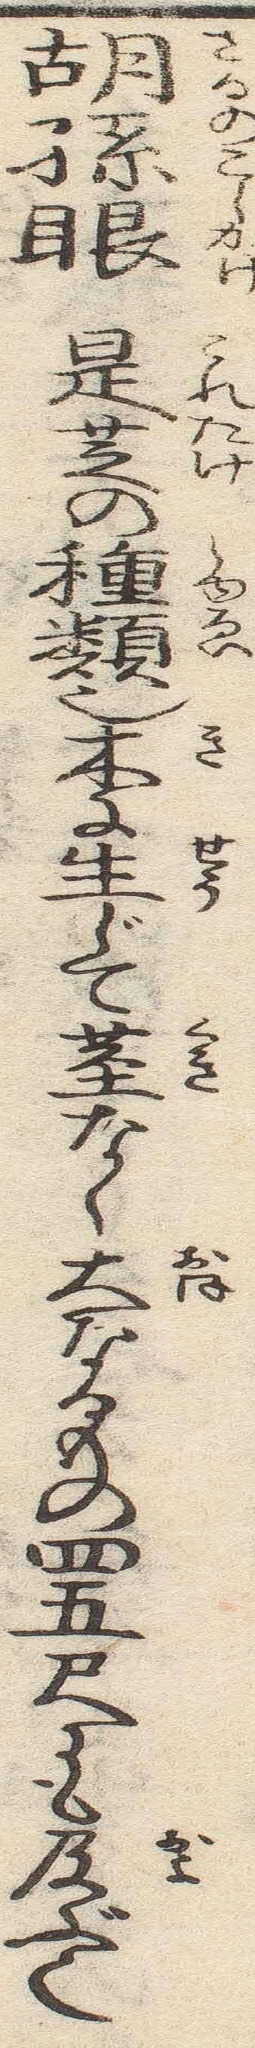胡孫眼是芝の種類也木に生じて茎なし大なるもの四五尺にも及ぶ也
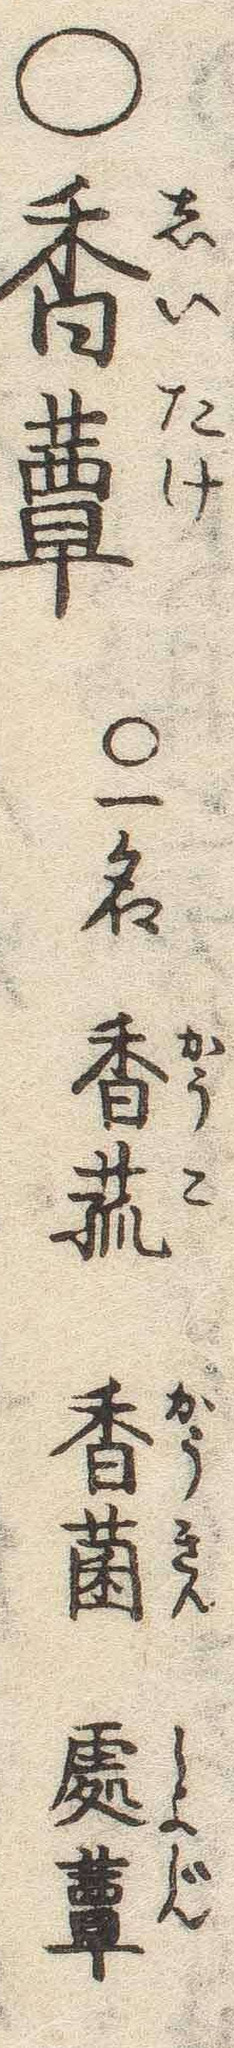○香蕈○一名香菰香菌処蕈
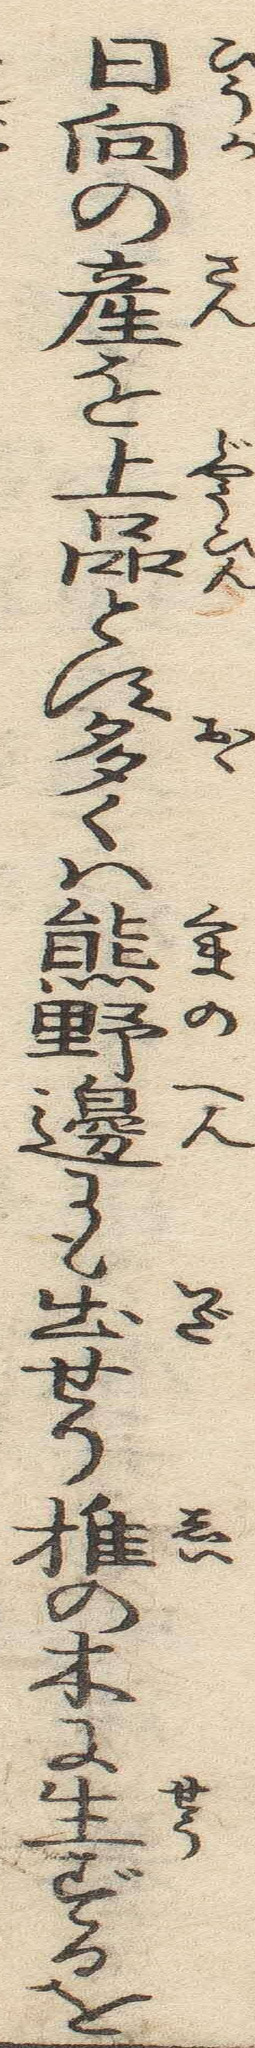日向の産を上品とす多くは熊野辺にも出せり椎の木に生ずるを
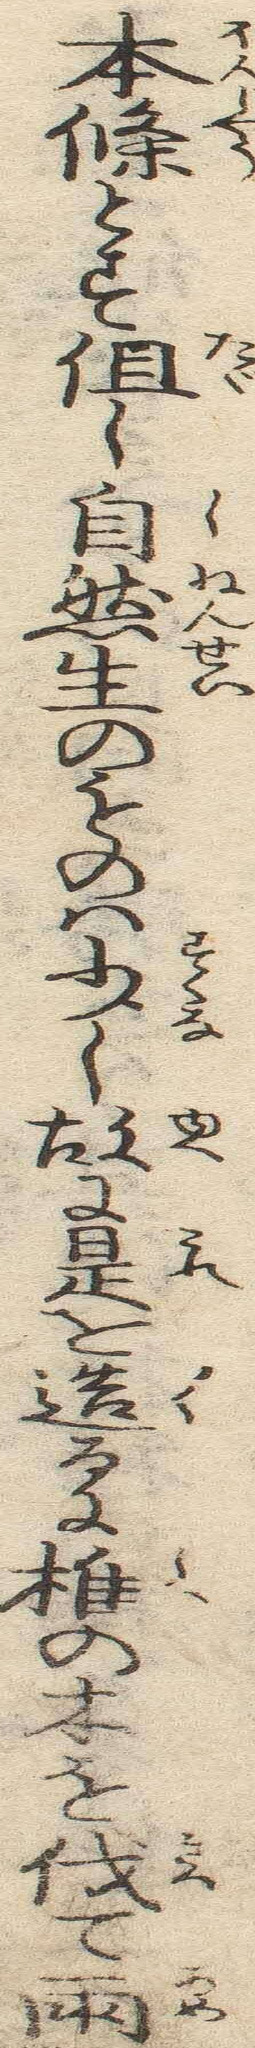本條とす但し自然生のものは少し故に是を造るに椎の木を伐て雨
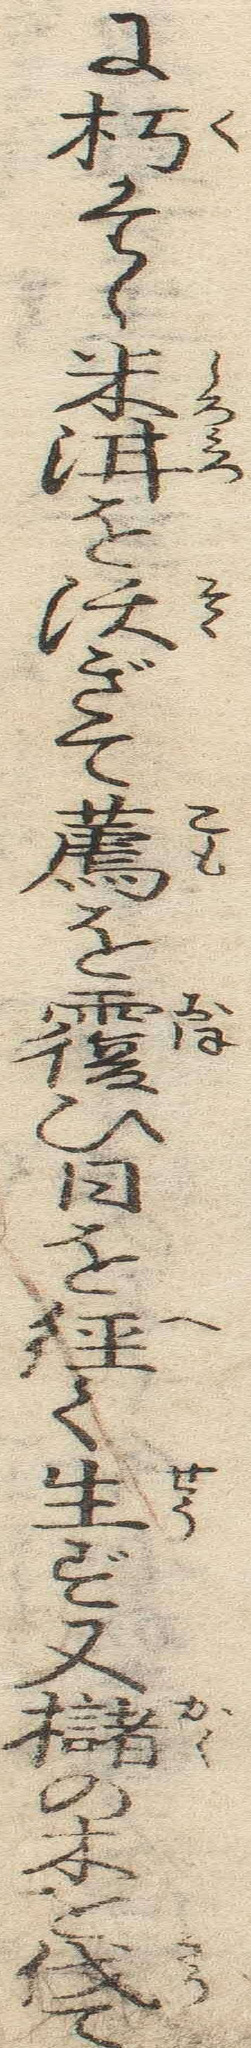に朽たし米泔を沃ぎて薦を覆ひ日を経て生ず又櫧の木を伐て
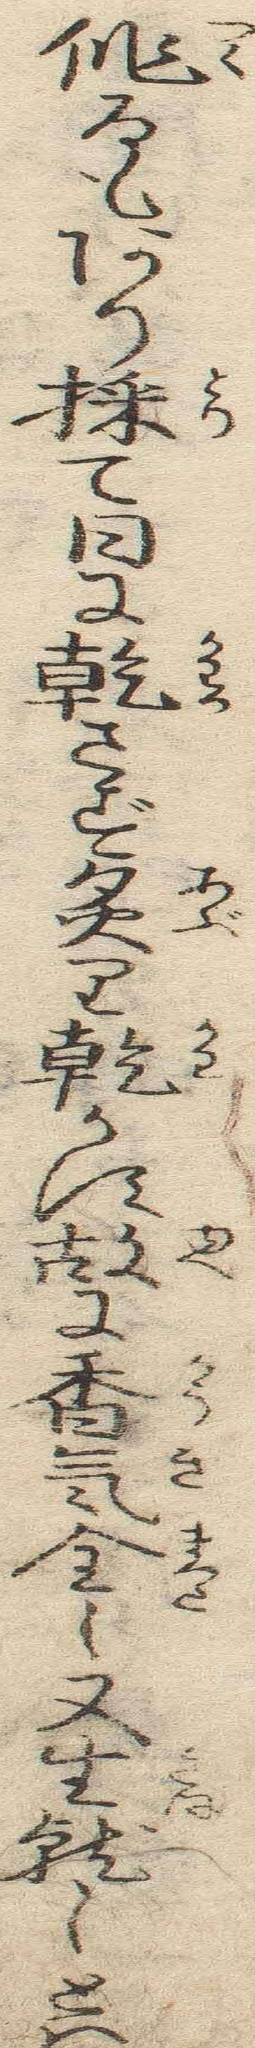作るもあり採て日に乾さず炙り乾かす故に香気全し又生乾しとは
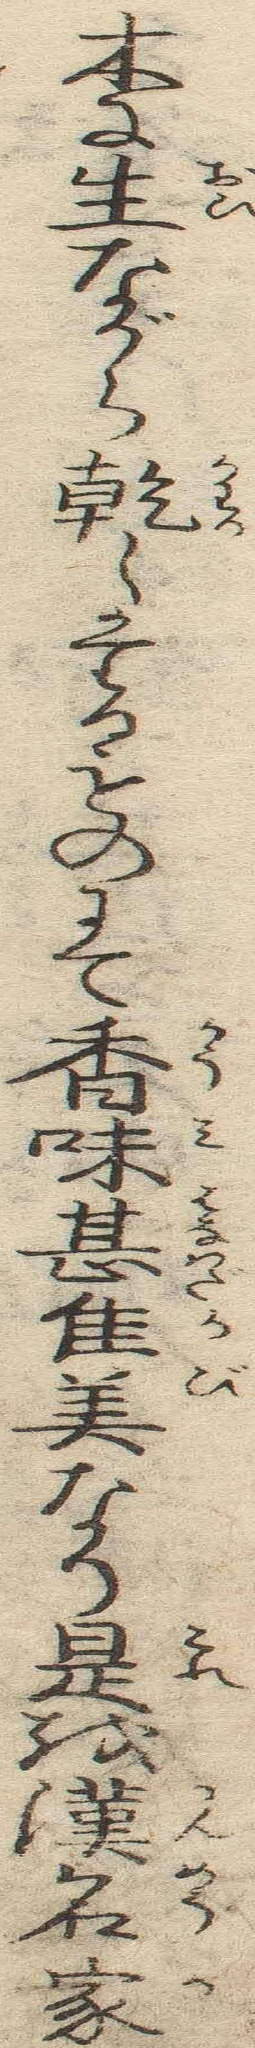木に生ながら乾したるものにて香味甚隹美なり是を漢名家
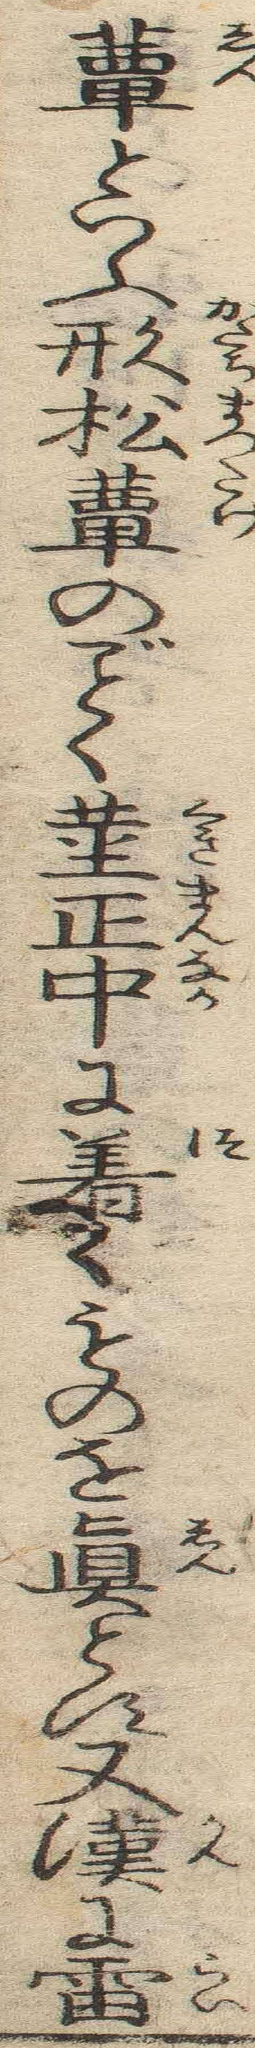蕈といふ形松蕈のごとく茎正中に着くものを真とす又漢に雷
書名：日本山海名産図会
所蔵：東京学芸大学附属図書館 国文学研究資料館
